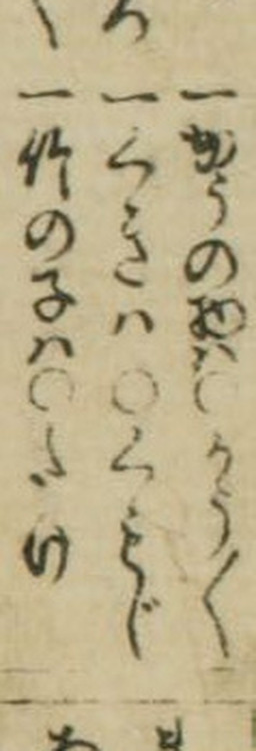一くきは○くもじ
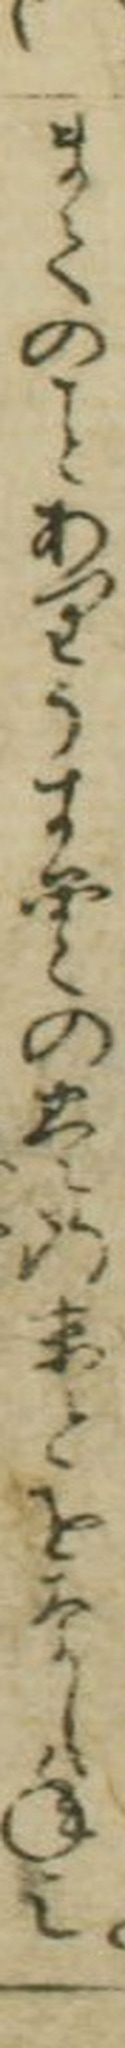まてのことありうす雲の巻の末とをなし年也。
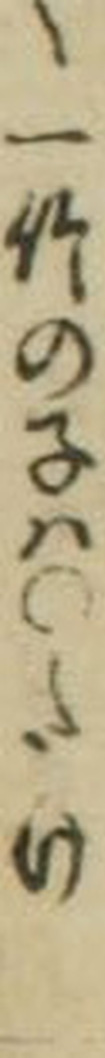一竹の子は○たけ
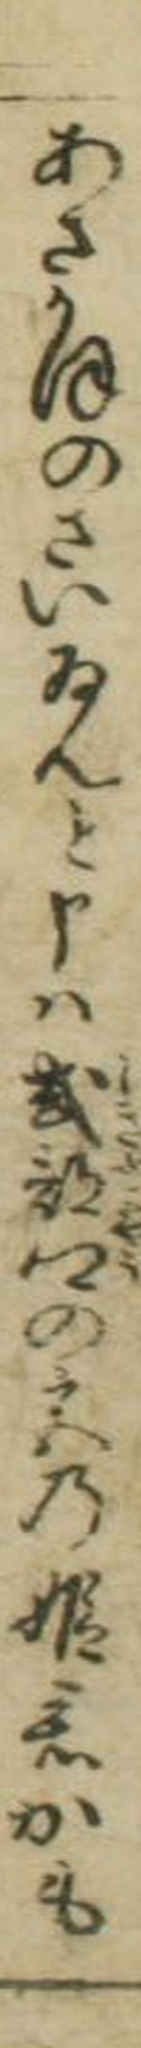あさかほのさいゐんと申は式部卿の宮の姫君かも
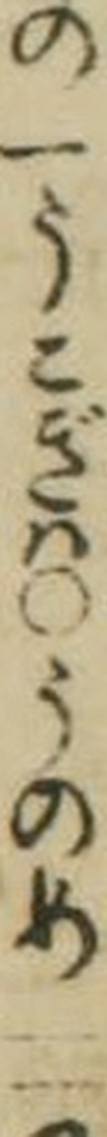一うこぎは○うのめ
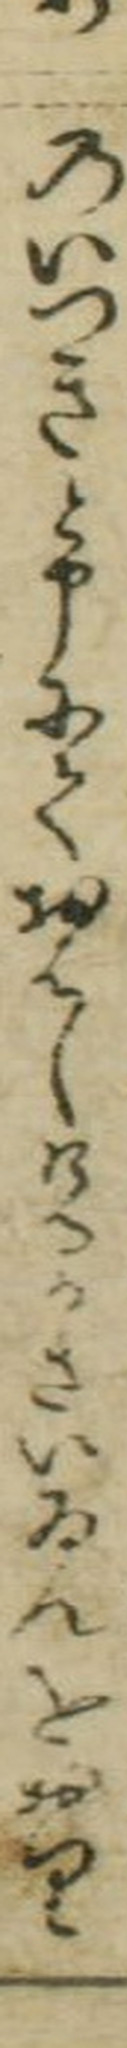のいつきと申にておはしけるかさいゐんをおり
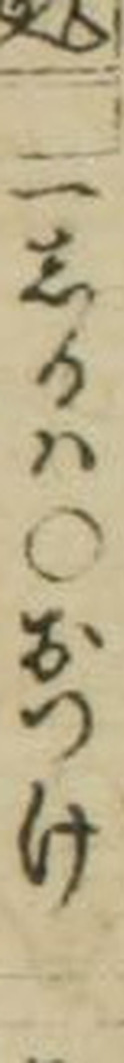一しるは○おつけ
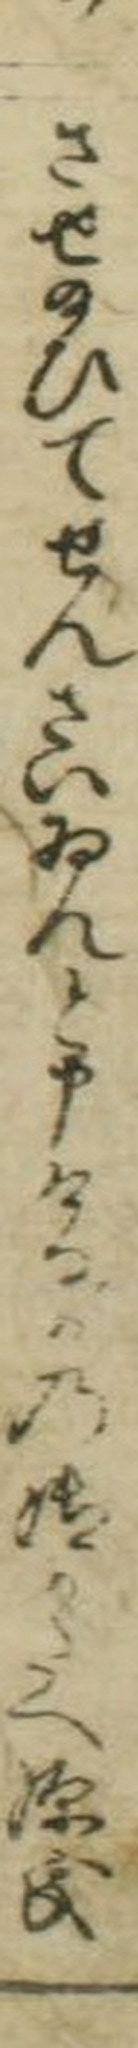させ給ひてせんさいゐんと申ける。かの御かたへ源氏
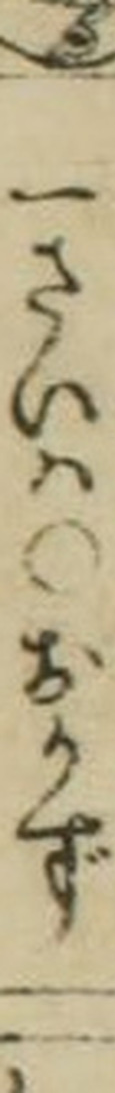一さいは○おかず
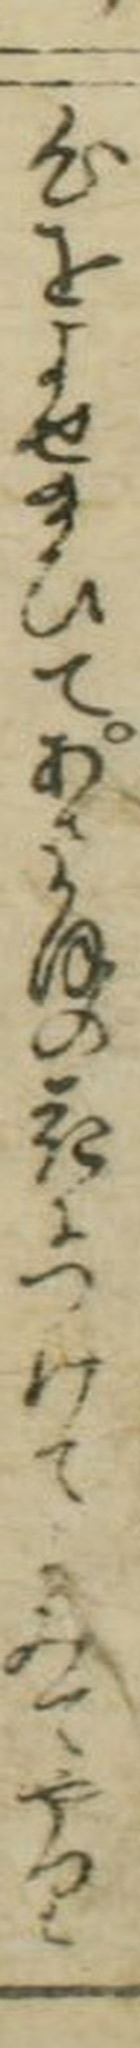心をよせ給ひて。あさかほの花につけてよみてやり
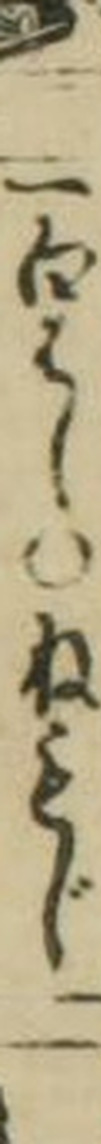一白はし○ねもじ
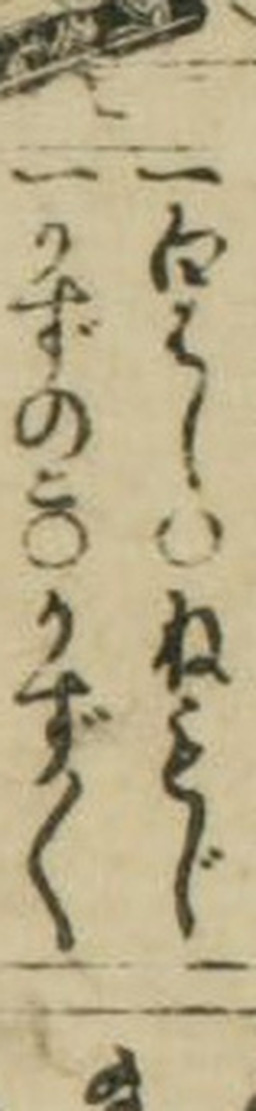一かずのこ○かず〳〵
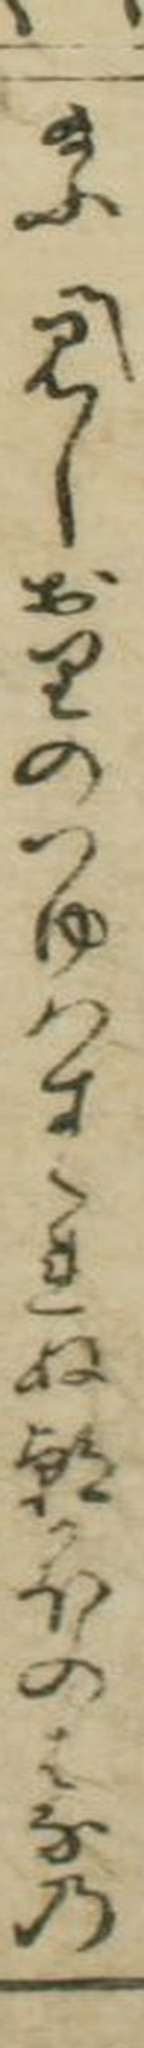給ふ〽見しおりのつゆわすられぬ朝かほのはなの
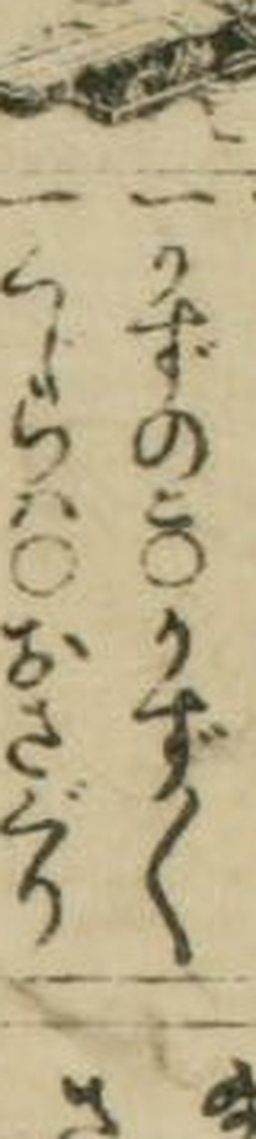一くじらは○おさぐり
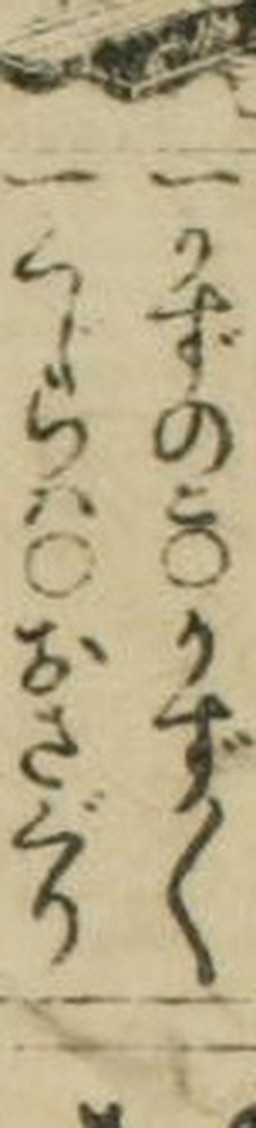一くじらは○おさぐり
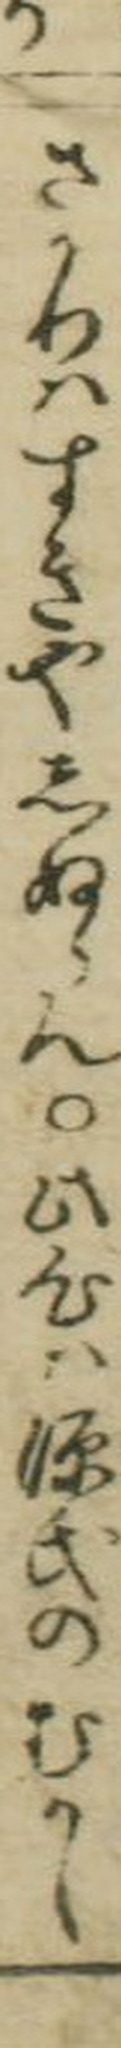さかりはすきやしぬらん○此心は源氏のむかし
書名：女源氏教訓鑑
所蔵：東京学芸大学附属図書館
